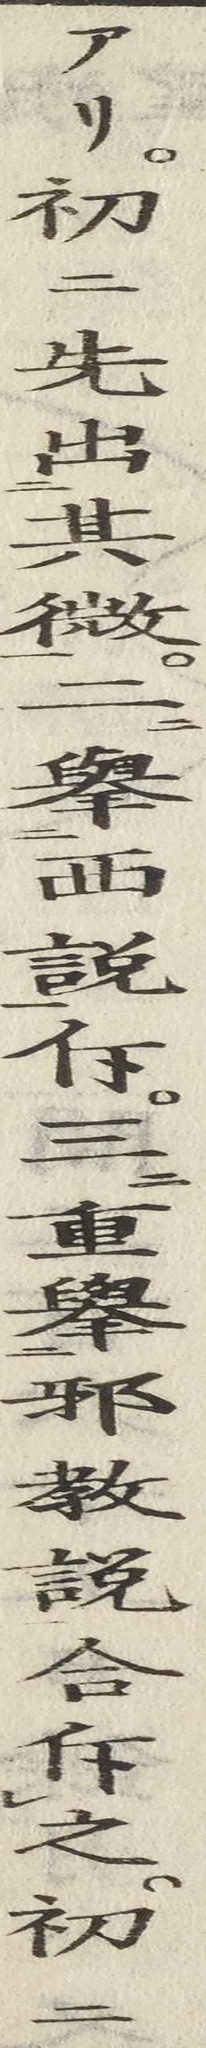アリ。初ニ先出ニ其微。ニニ挙ニ西説斥。三ニ重挙ニ邪教説合斥之。初ニ
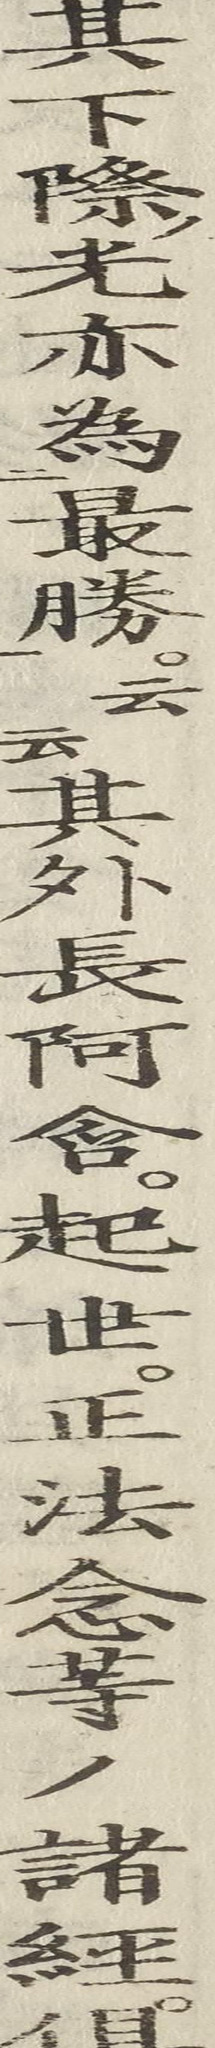其下際光亦為ニ最勝。云云其外長阿含。起世。正法念等ノ諸経。倶
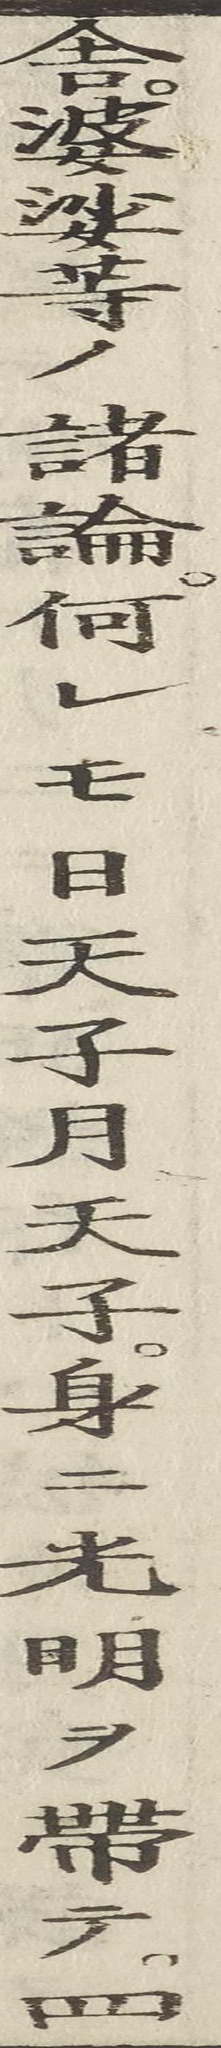舎。婆娑等ノ諸論。何レモ日天子月天子。身ニ光明ヲ帯テ。四
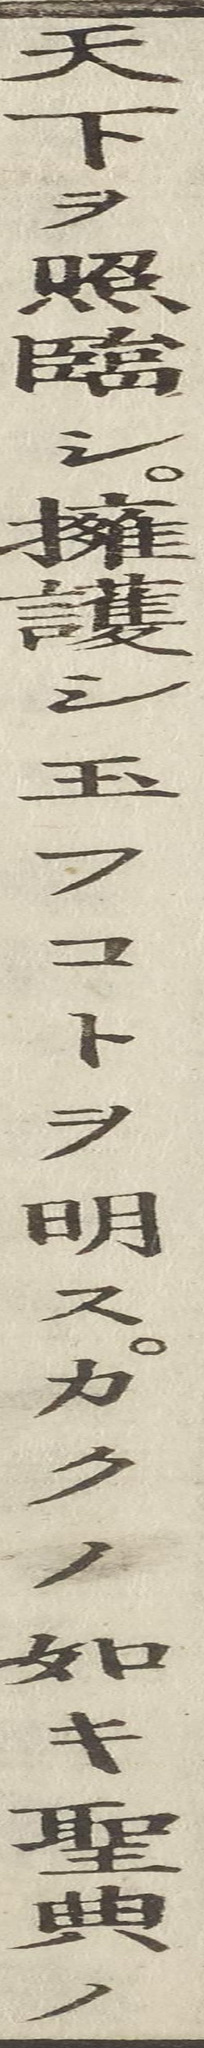天下ヲ照臨シ。擁護シ玉フコトヲ明ス。カクノ如キ聖典ノ

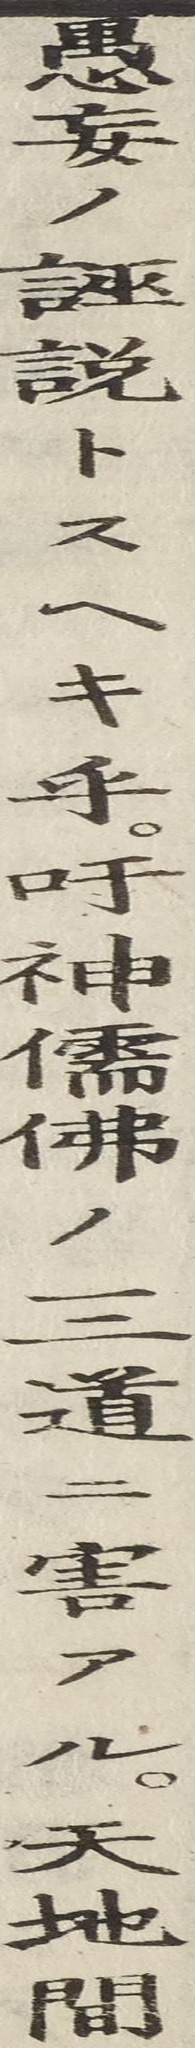愚妄ノ誣説トスヘキ乎。吁神儒仏ノ三道ニ害アル。天地間
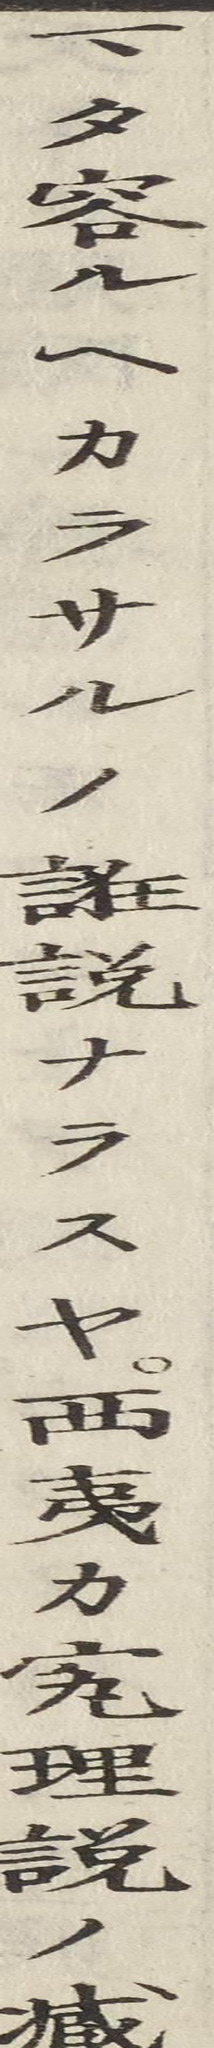マタ容ルヘカラサルノ誑説ナラスヤ。西夷カ究理説ノ臧
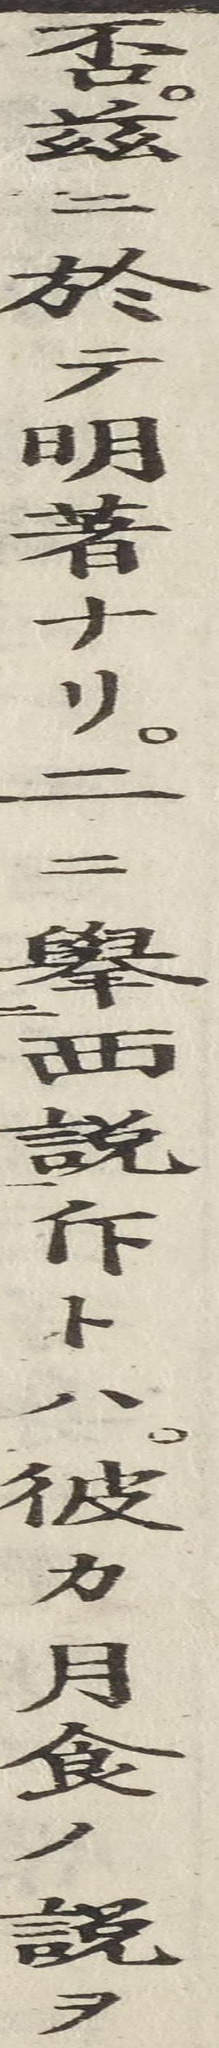否。茲ニ於テ明著ナリ。二ニ挙ニ西説斥トハ。彼カ月食ノ説ヲ
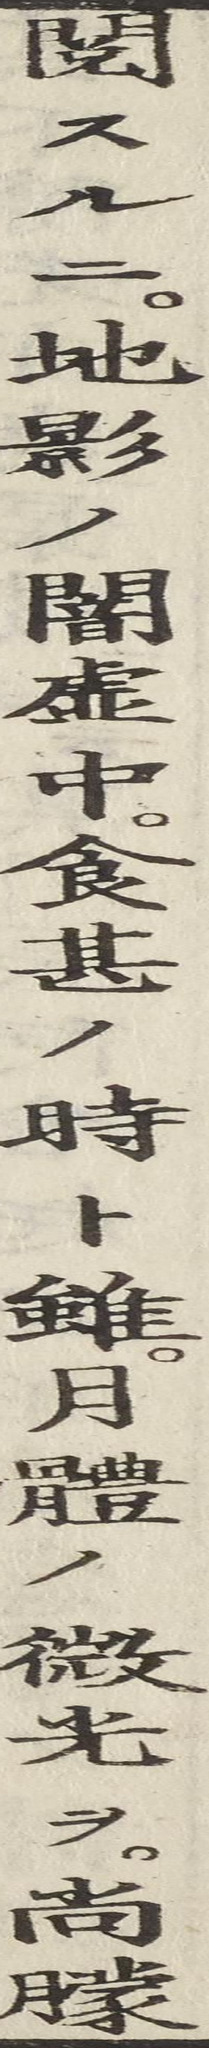閲スルニ。地影ノ闇虚中。食甚ノ時ト雖。月体ノ微光ヲ。尚朦
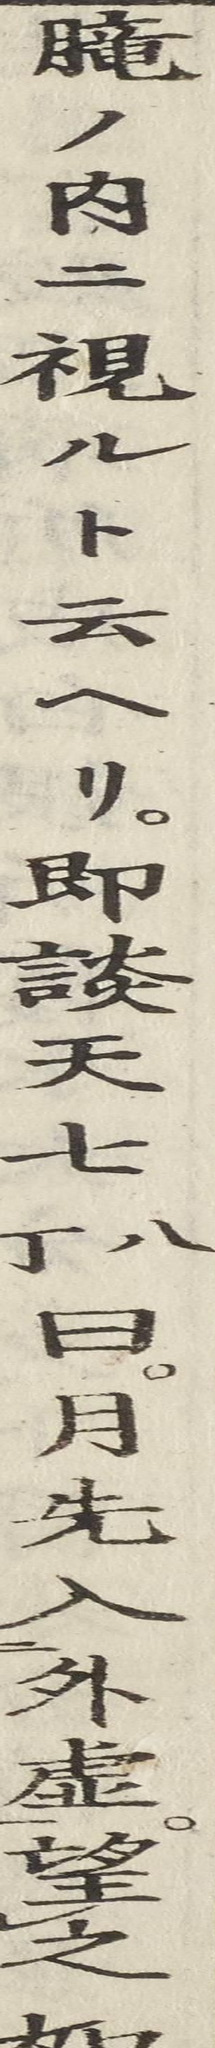朧ノ内ニ視ルト云ヘリ。即談天七八丁曰。月先入ニ外虚。望之如
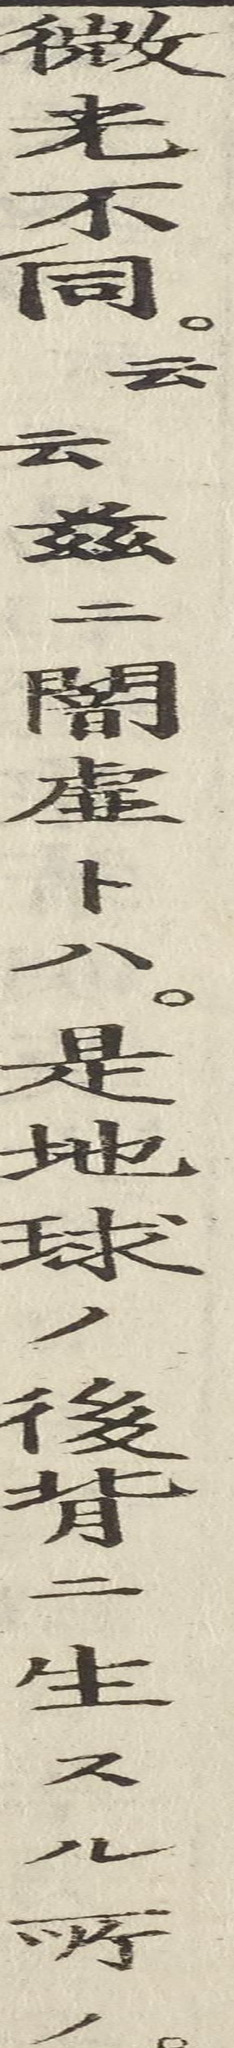微光不同。云云茲ニ闇虚トハ。是地球ノ後背ニ生スル所ノ。
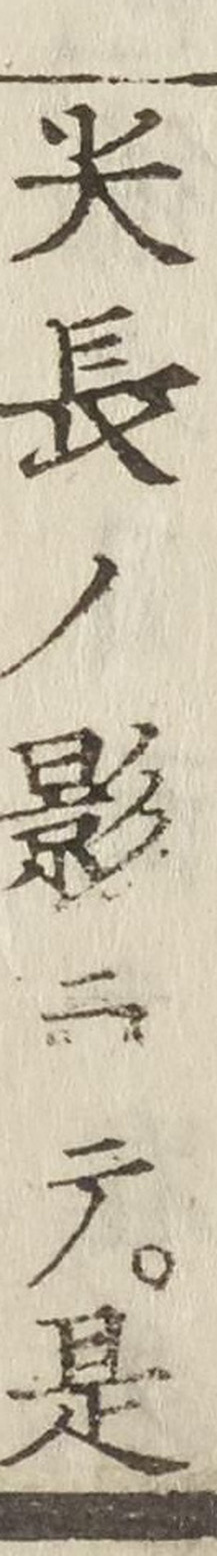光長ノ影ニテ。是
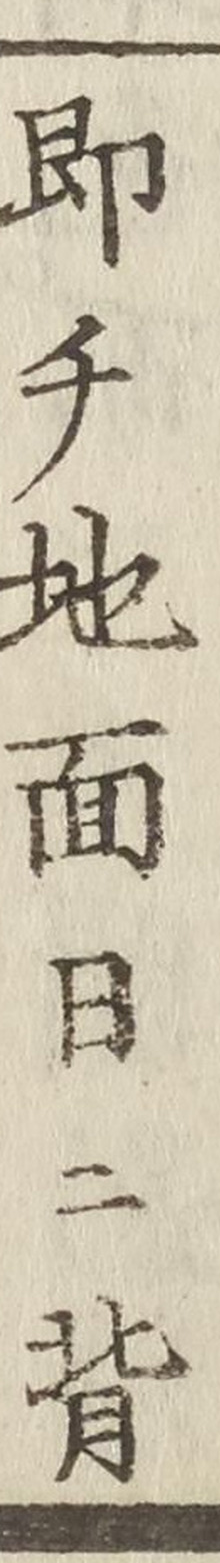即チ地面日ニ背
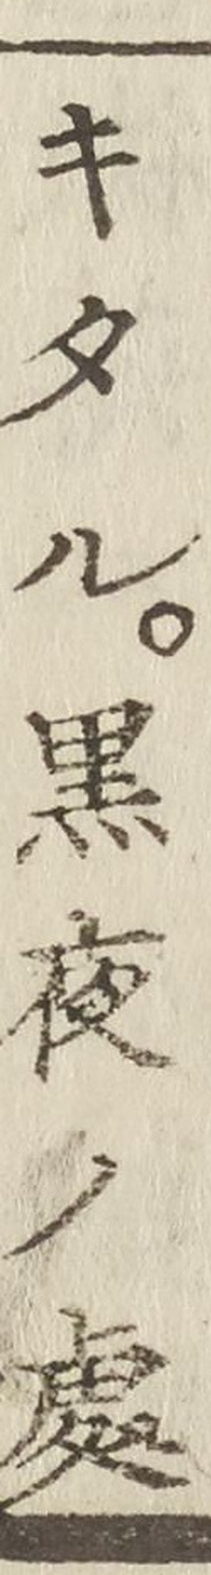キタル。黒夜ノ処
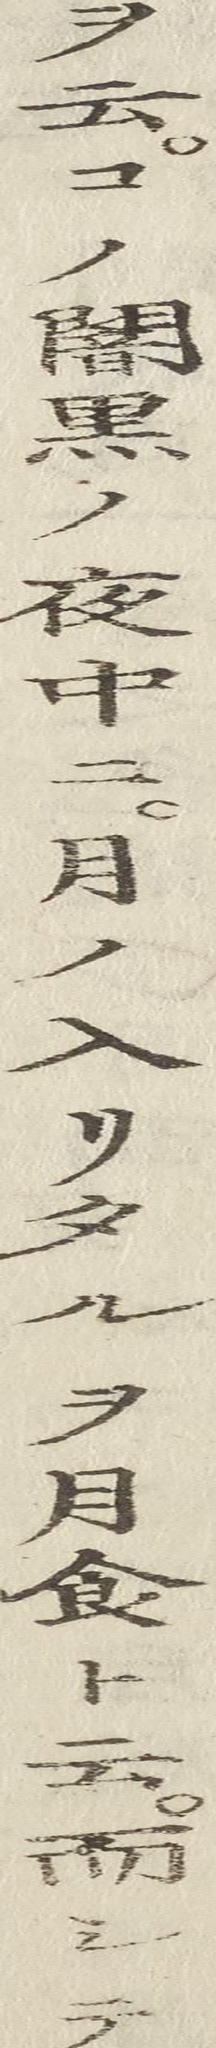ヲ云。コノ闇黒ノ夜中ニ。月ノ入リタルヲ月食ト云。而シテ
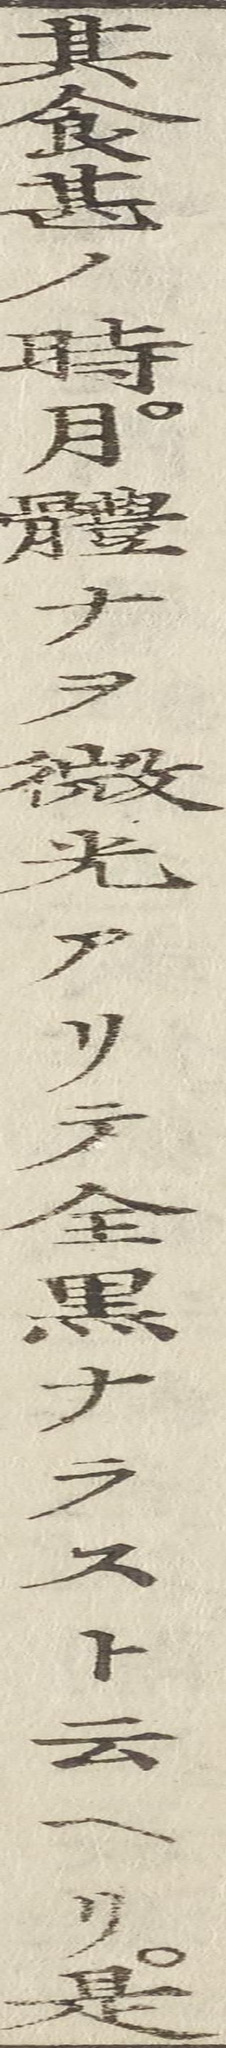其食甚ノ時。月体ナヲ微光アリテ全黒ナラスト云ヘリ。是
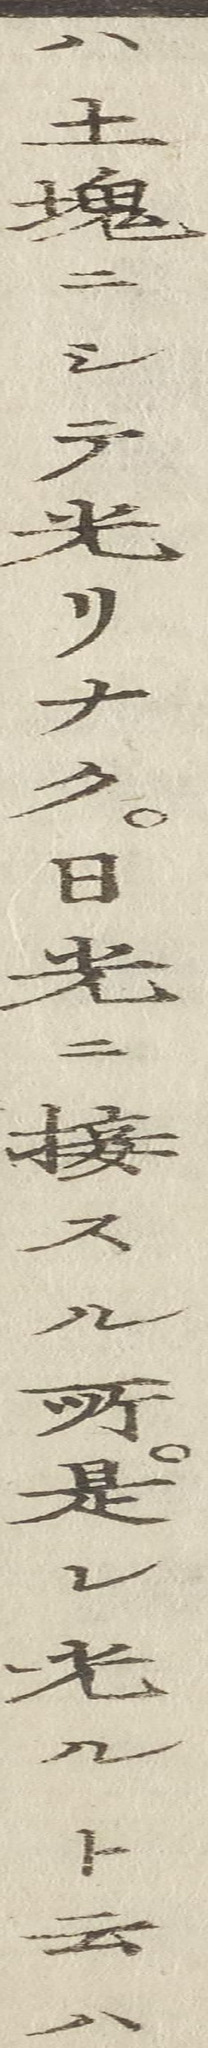ハ土塊ニシテ光リナク。日光ニ接スル所。是レ光ルト云ハ
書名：護法新論　二編　下
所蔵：東京大学地震研究所図書室 Earthquake Research Institute Library, The University of Tokyo, JAPAN
